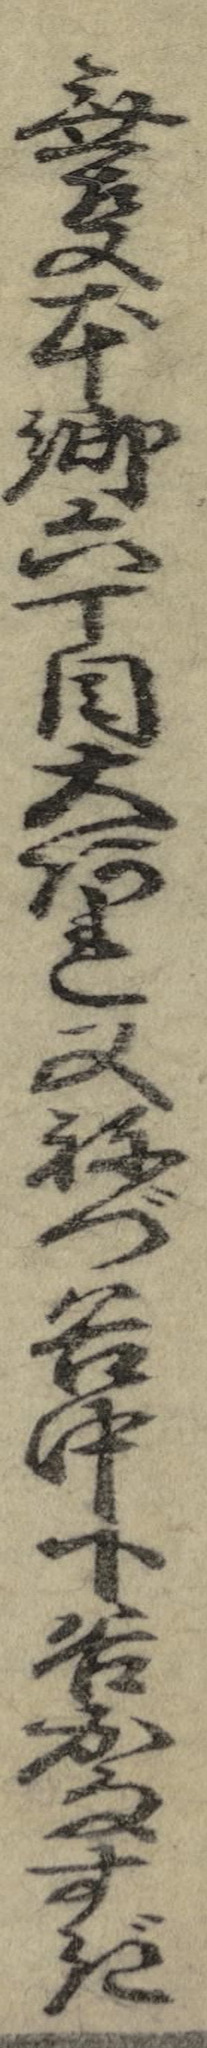無事本郷六丁目大あれ又ねづ谷中下谷かなすぎ
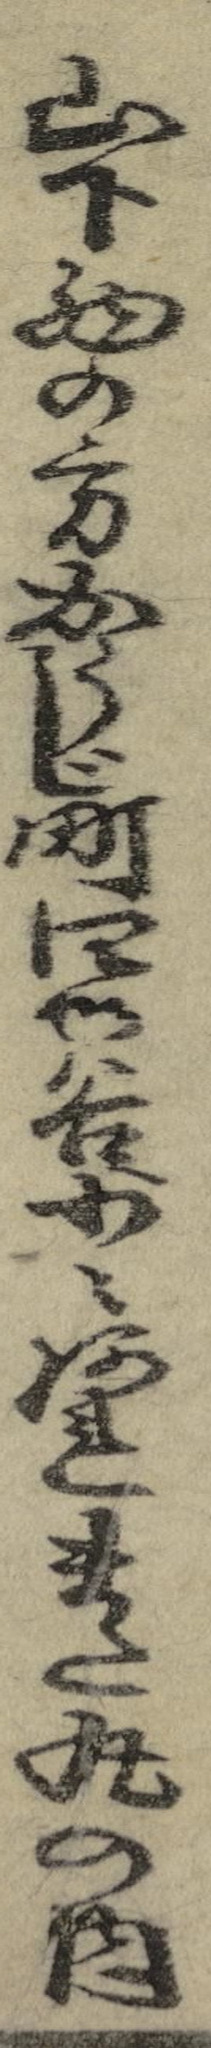山下西の方かうじ町四ツ谷少々あれまた丸の内
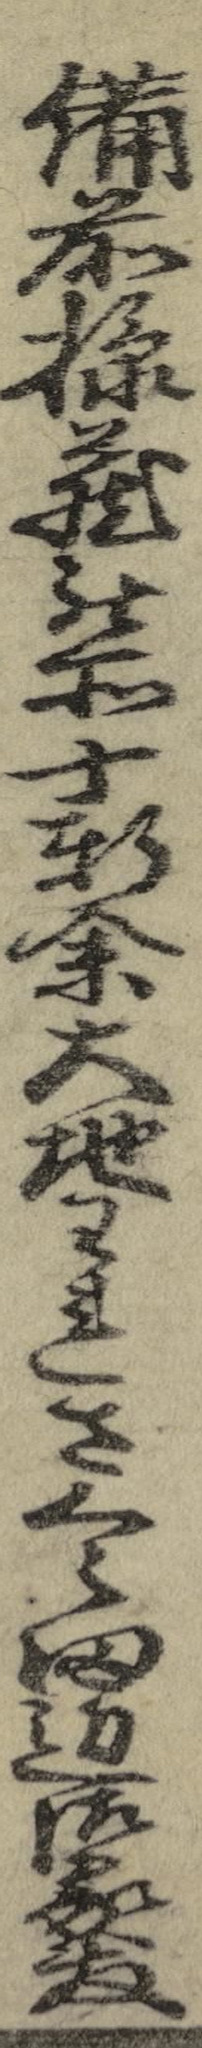備前様蔵の所十軒余大地われさくら田辺御家敷
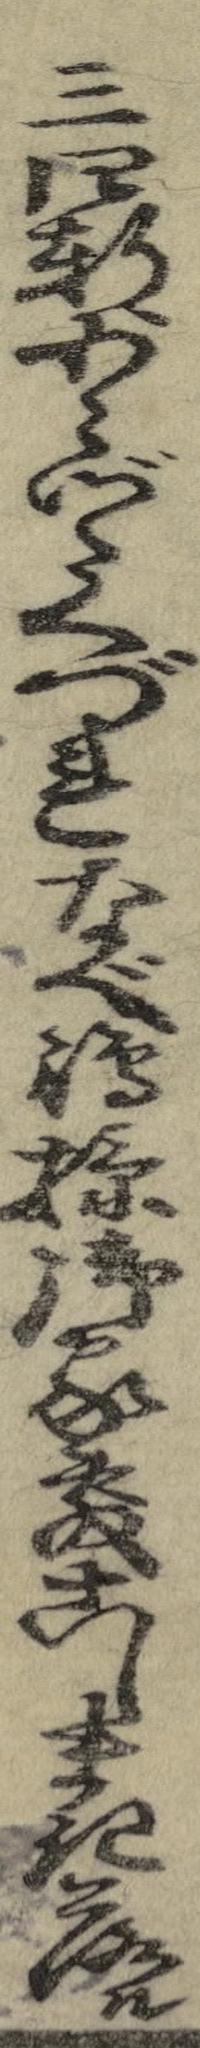三四軒少々づゝくづれなべ嶋様御家敷こしまき落る
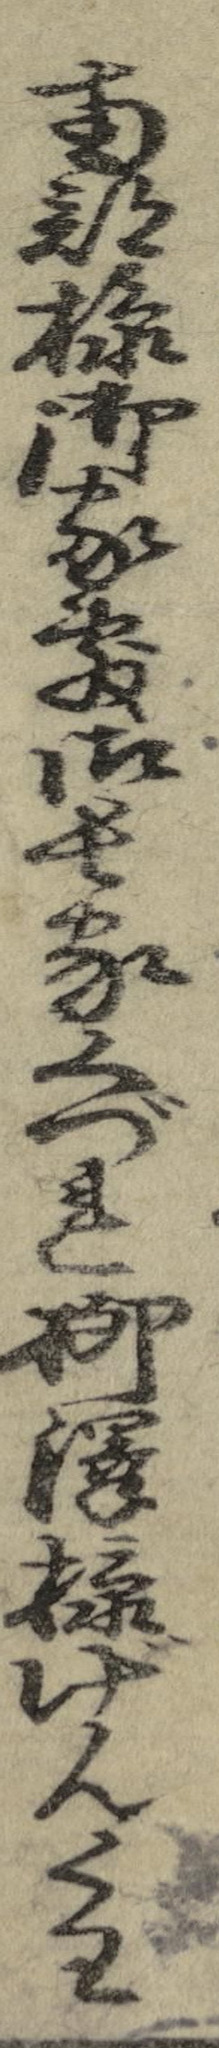南部様御家敷御長家くづれ柳澤様げんくわ
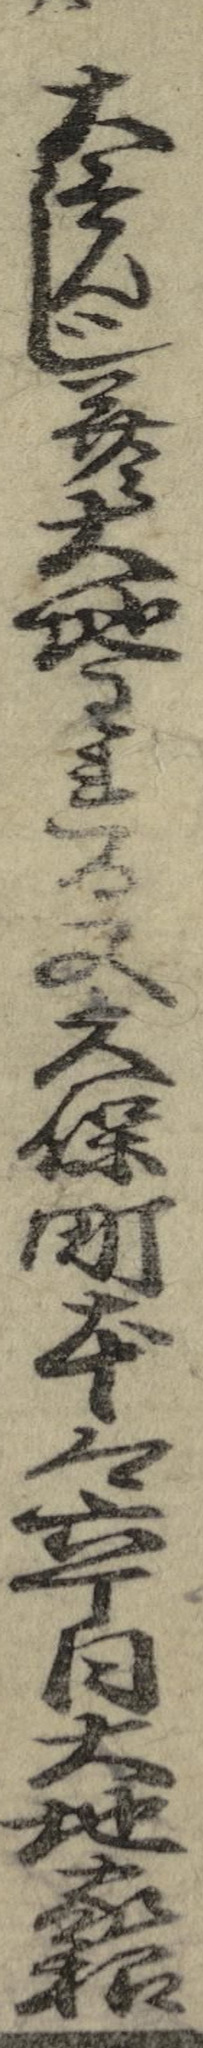大そんじ並に大地われる又久保町本郷六丁目大地家根
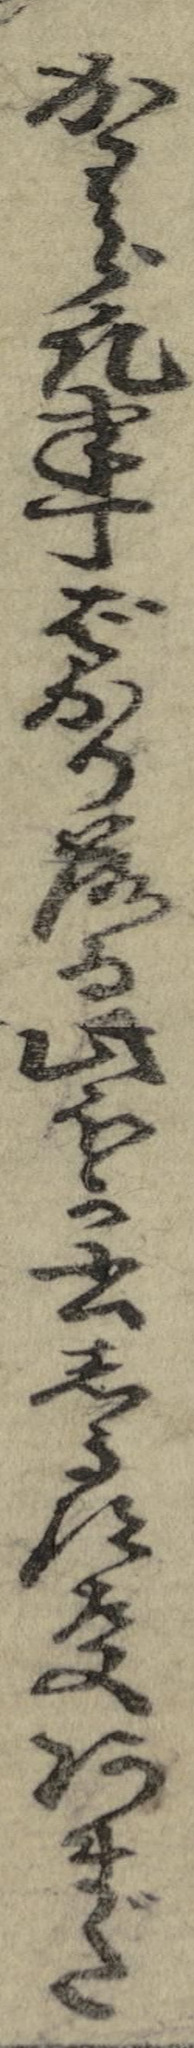かわら凡半丁ばかり落る此ほか書しるす事あまた
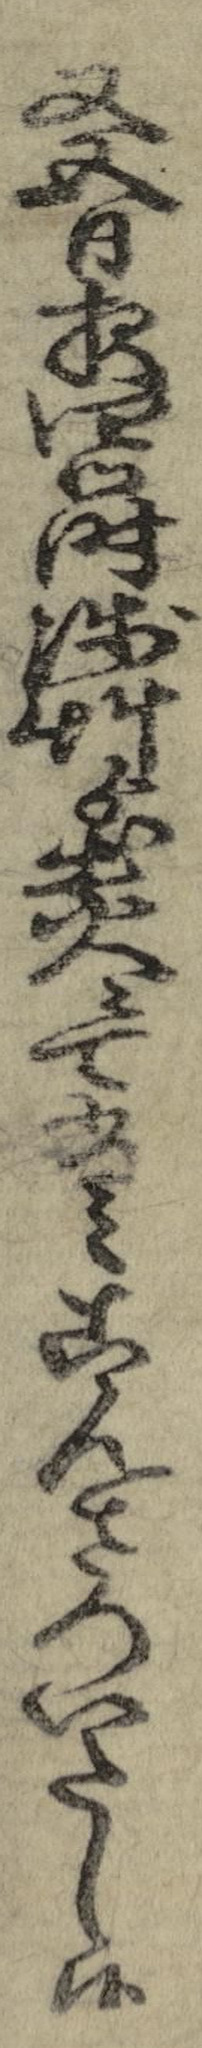又五日夜四ツ時浅草ゟ出火にて少々こんさついたし候
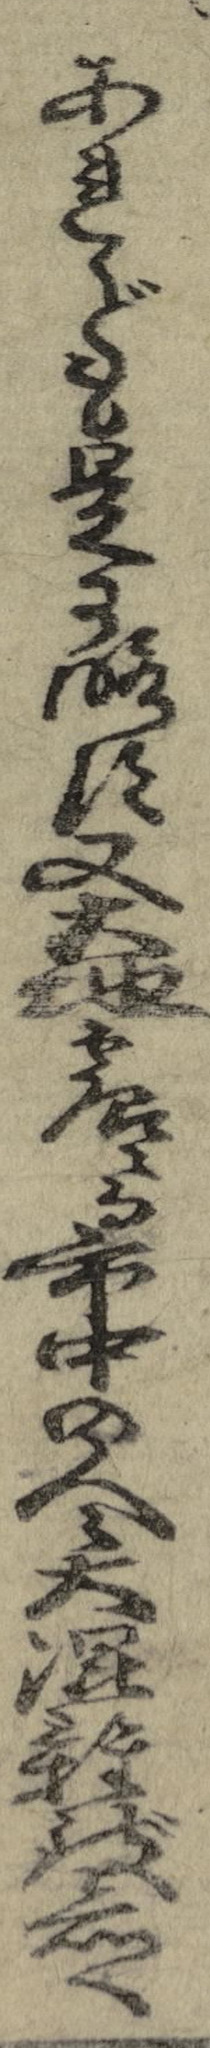あれども是に略す又大地震にて市中の人々大混雑致候所へ
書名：江戸大地震出火之圖本しらべニ仕候
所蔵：東京大学地震研究所図書室 Earthquake Research Institute Library, The University of Tokyo, JAPAN
